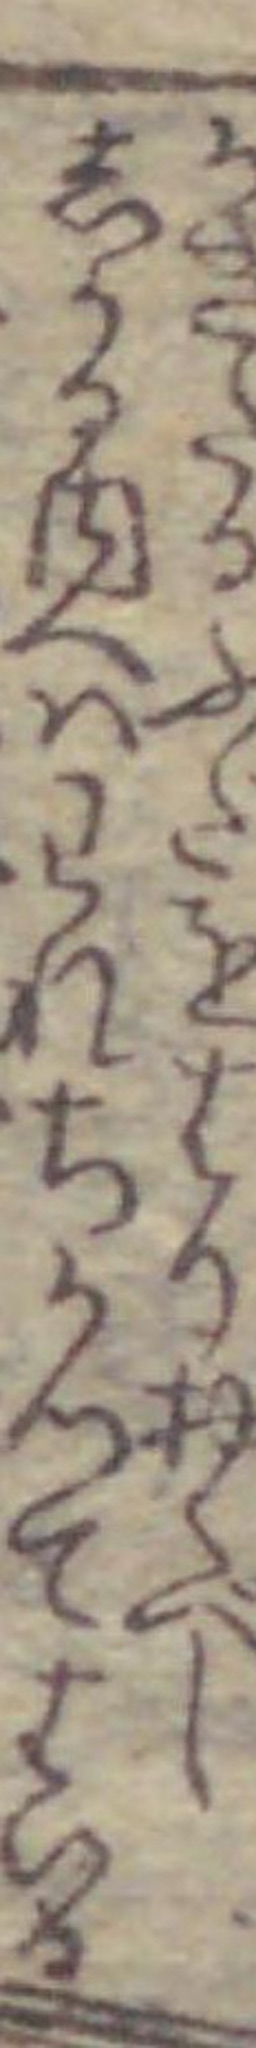しかる内へはわれちかつてはいる
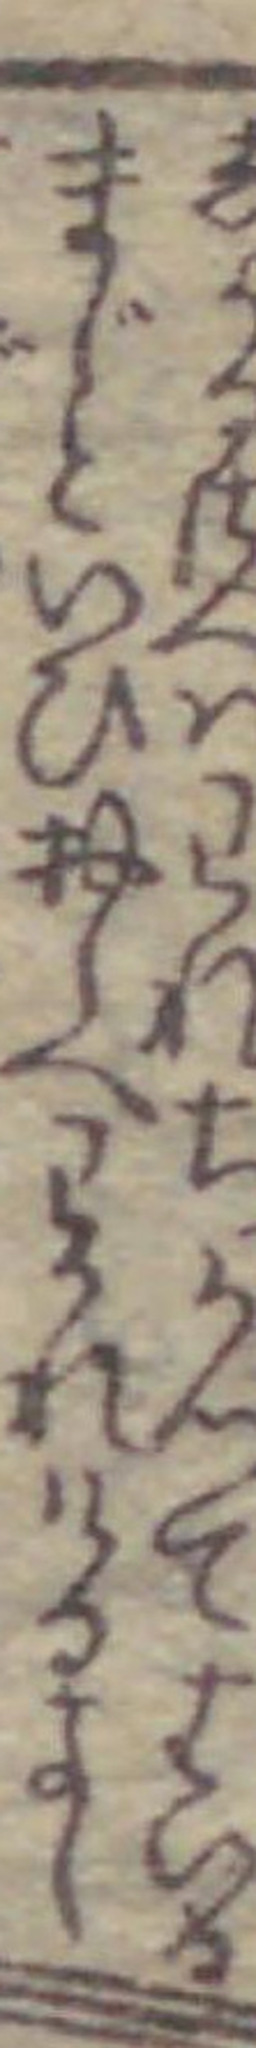まじといひおしへわかれけるよし
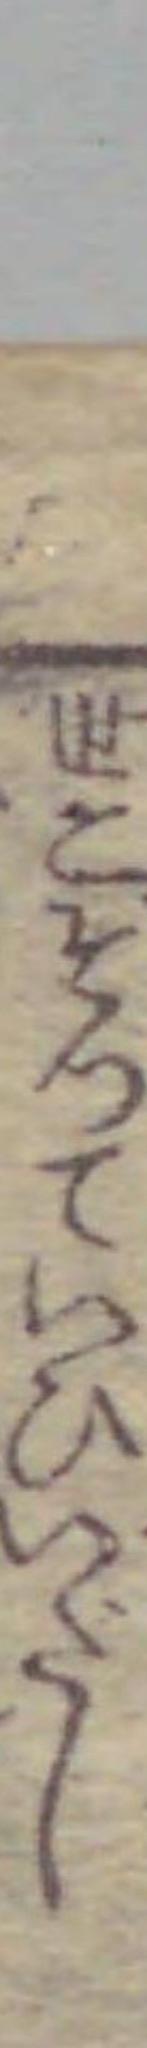世をぞつていひいだし
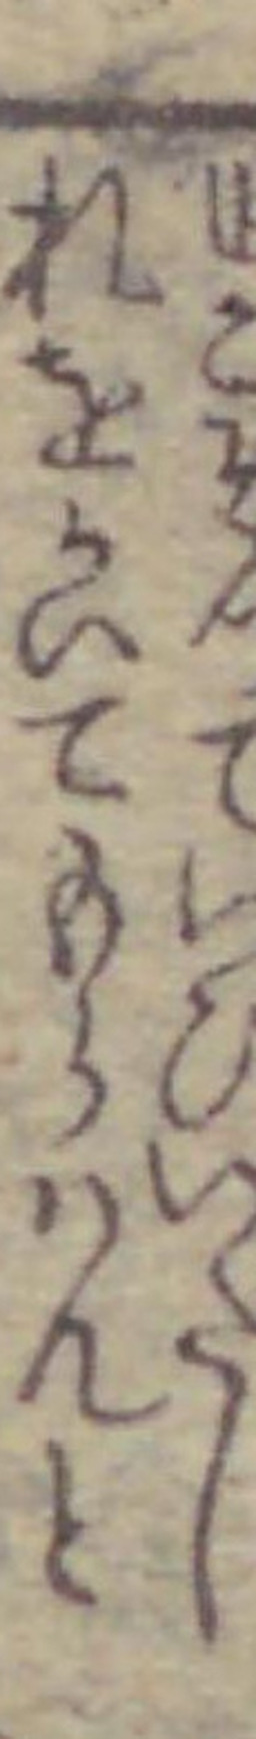札をかいてもらはんと
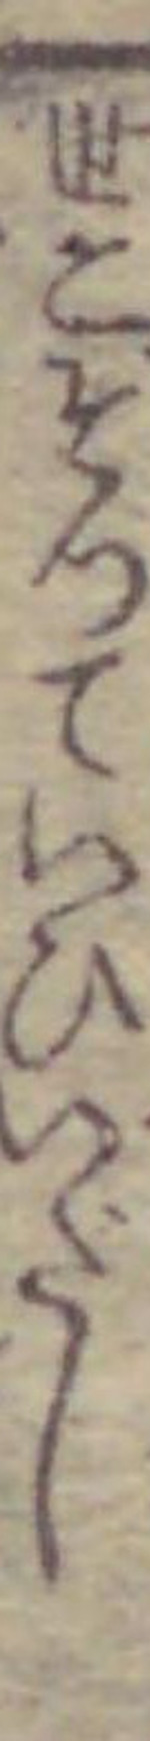世をぞつていひいだし
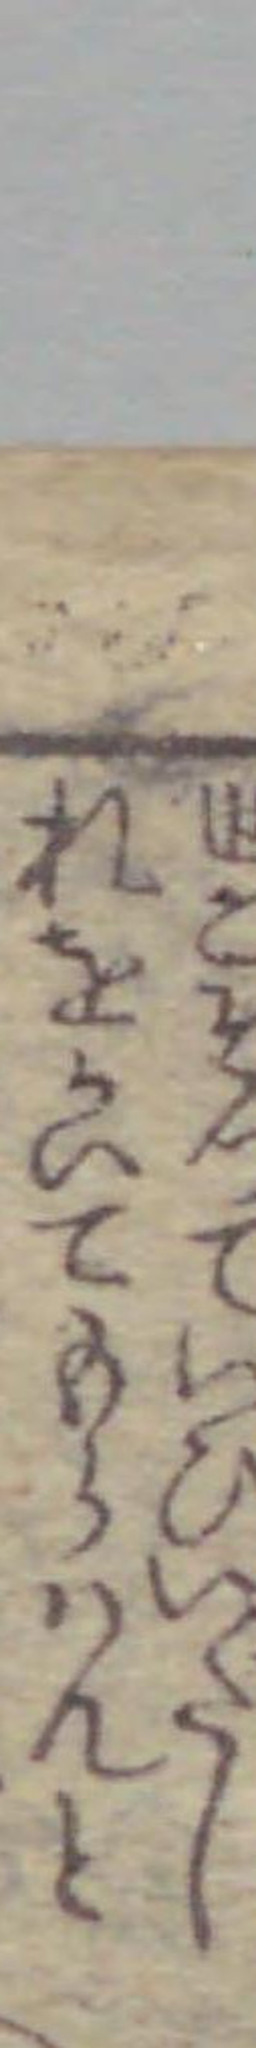札をかいてもらはんと
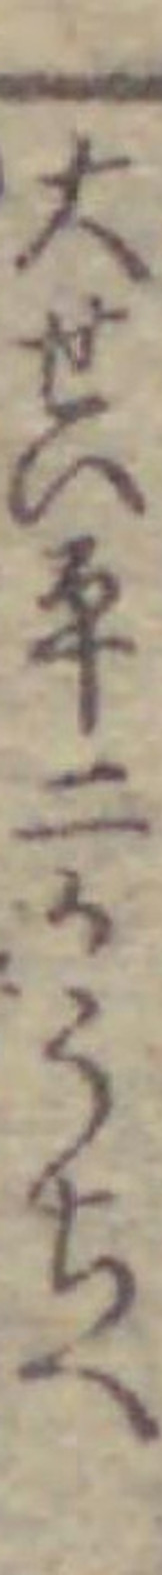大せい平二かうちへ
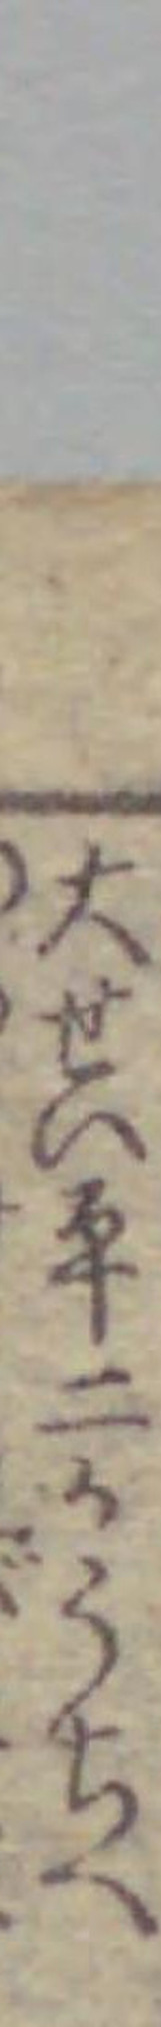大せい平二かうちへ
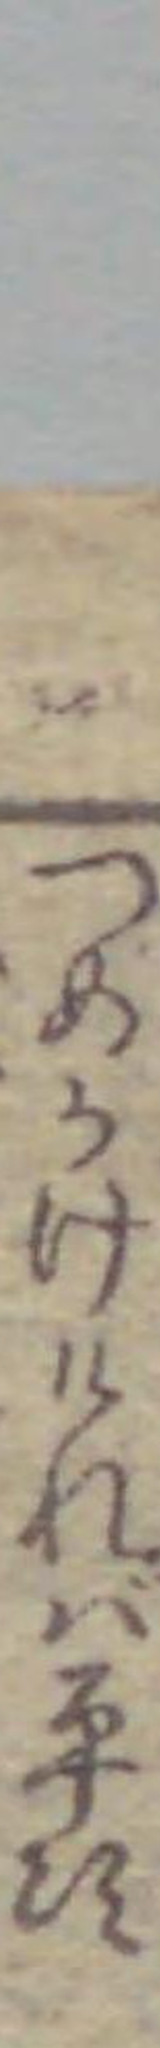つめかけければ平次
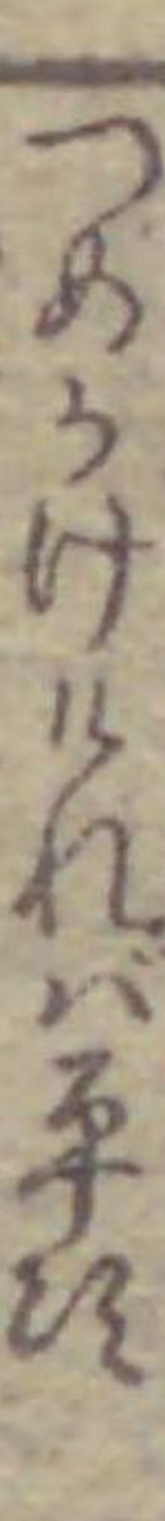つめかけければ平次
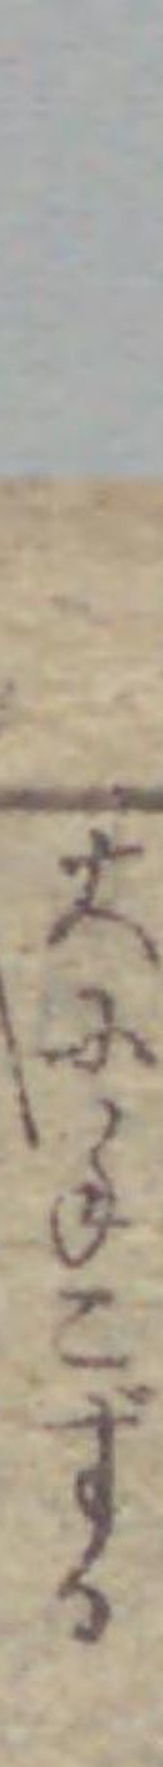大に手こずる
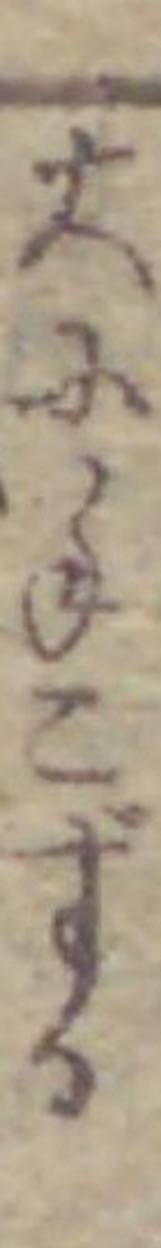大に手こずる
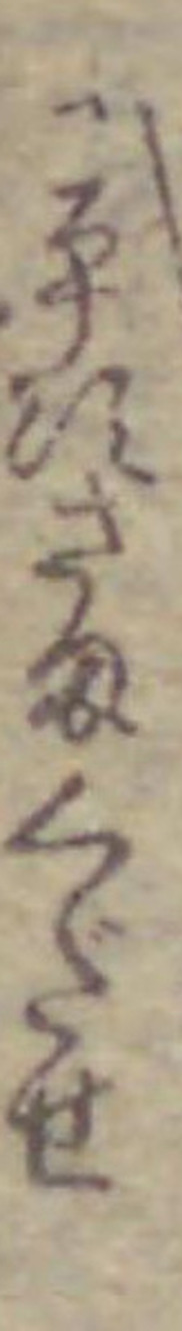〽平次さまくだせ
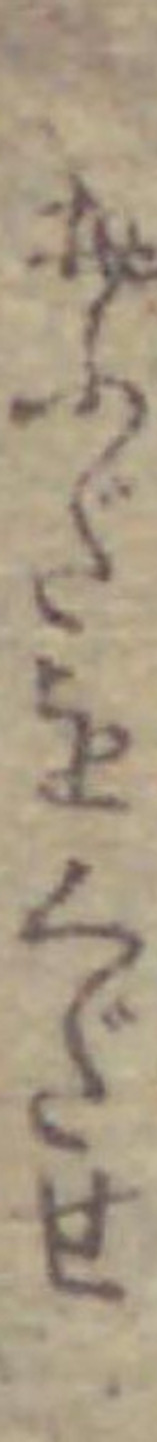おふだをくだせ
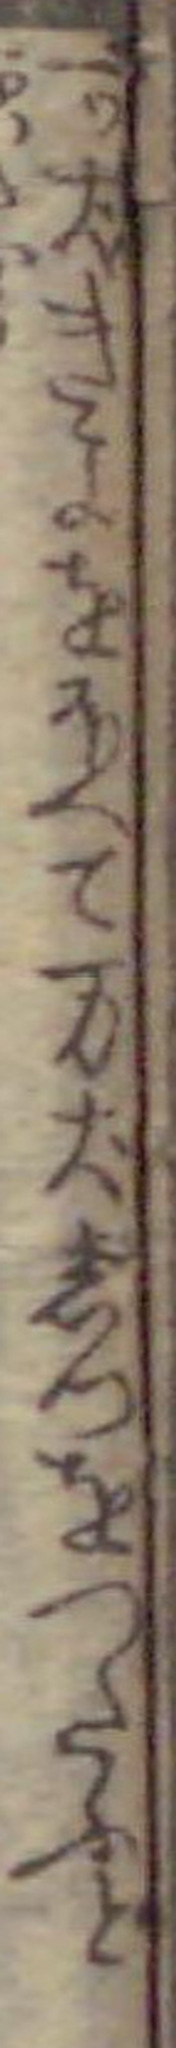一ッ犬きよをほへて万犬しつをつたふと
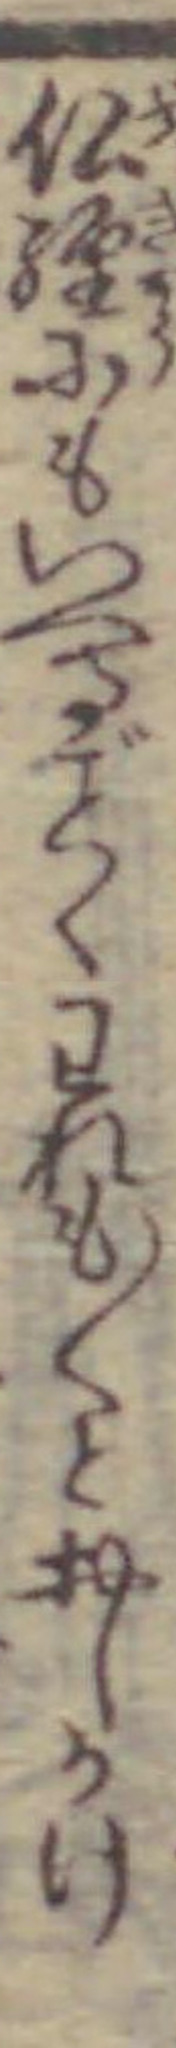仏経にもいへるごとくわれも〳〵とおしかけ
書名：箱入娘面屋人魚 3巻
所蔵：国立国会図書館 National Diet Library, JAPAN
